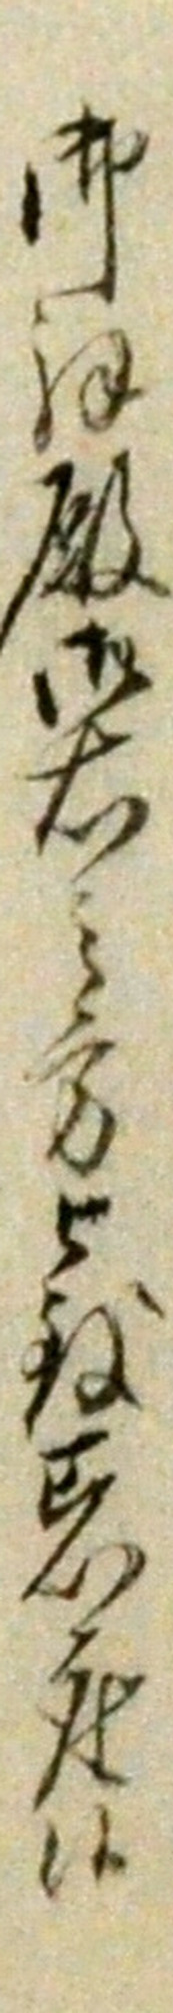御拝殿御右之方被致着座候

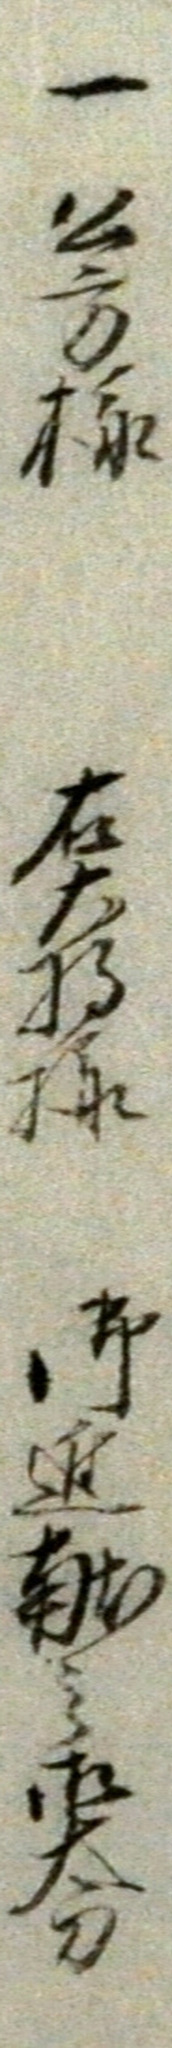一公方様右大将様御進献之御太刀
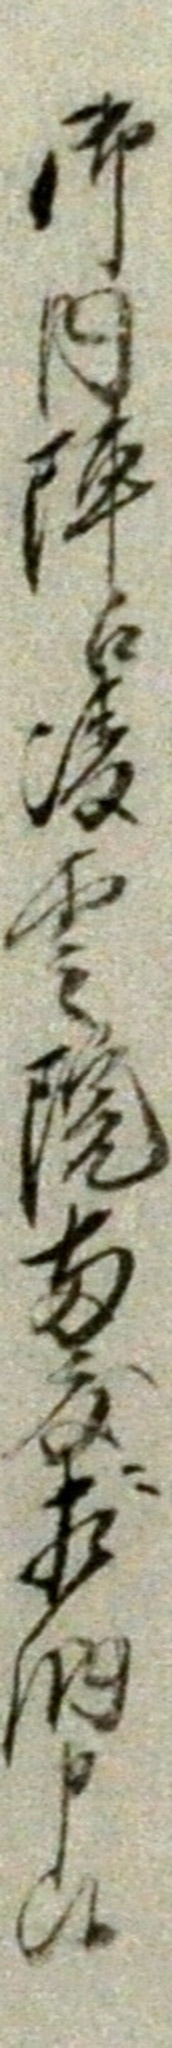御内陣え凌雲院両度ニ相納申候
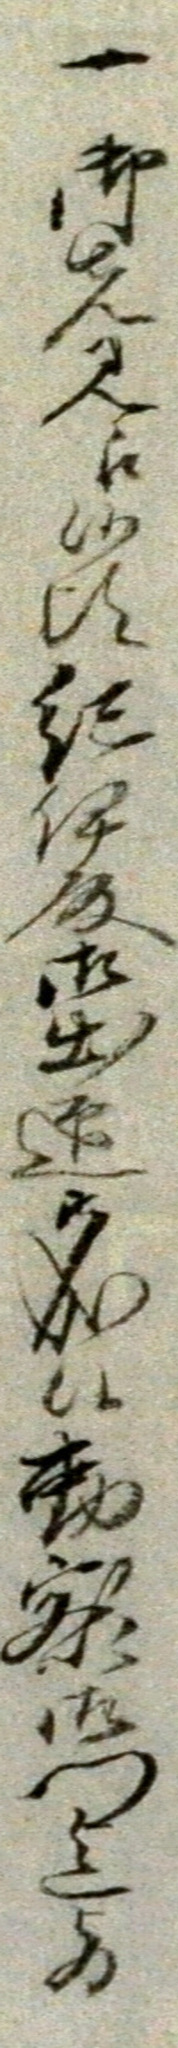一御先見え候頃紀伊殿御出迎被成候勅願御門迄被為
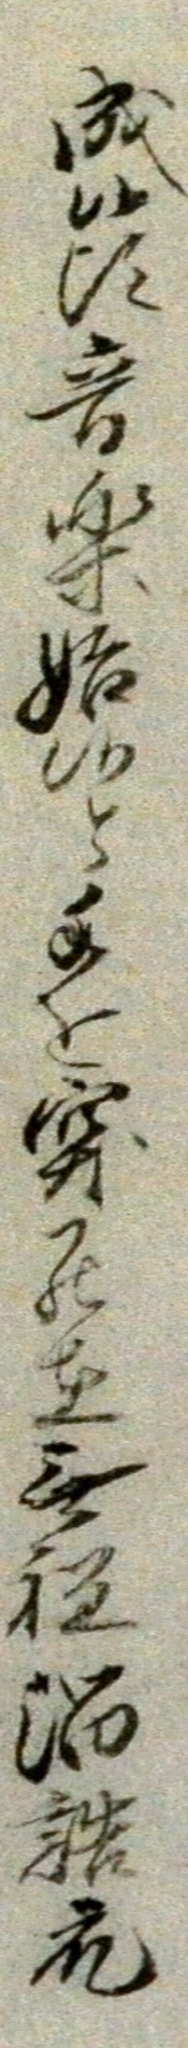成候頃音楽始候ハヽ手を突罷在無程溜詰衆
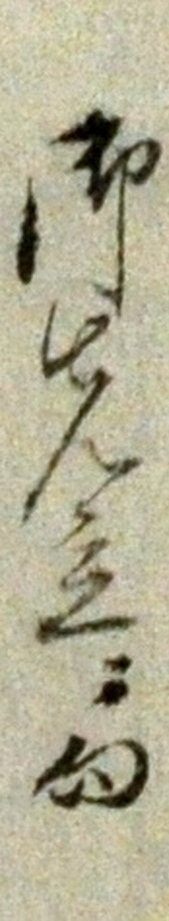御先立ニ而
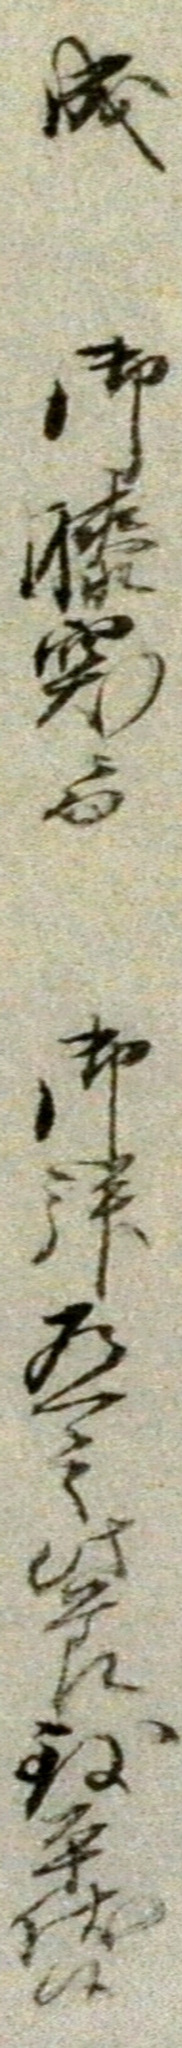成御膝突ニ而御拝有之此節致平伏候
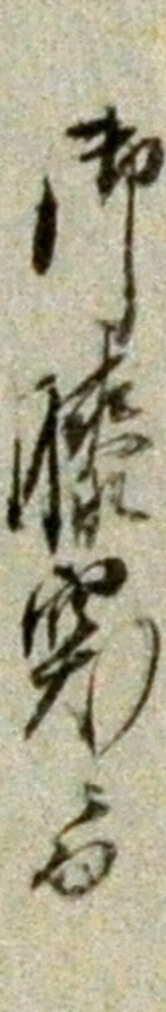御先立ニ而
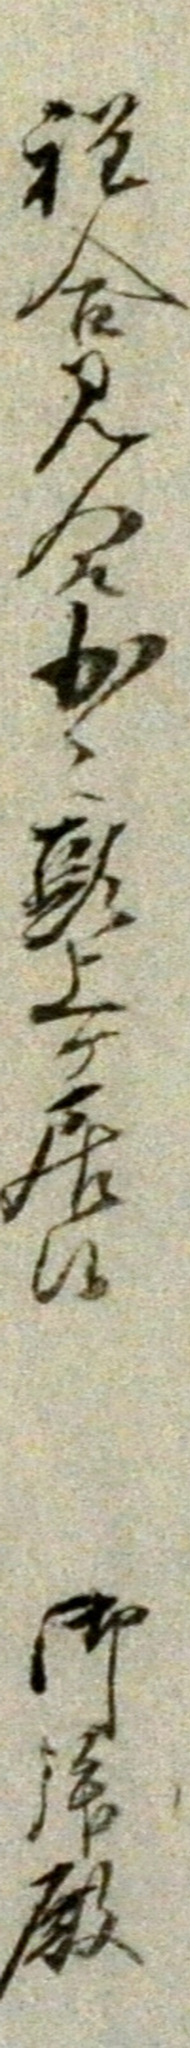程合見合少々顔上ケ居候御拝殿
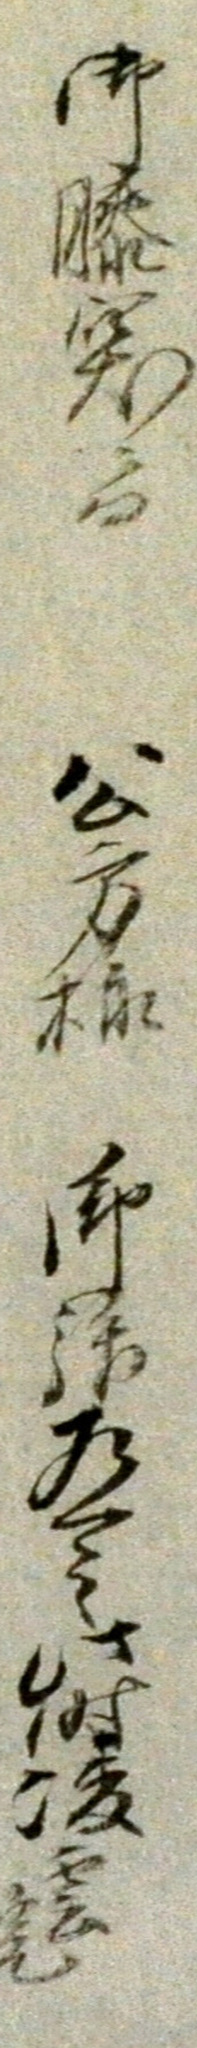御膝突ニ而公方様御拝有之此時凌雲院
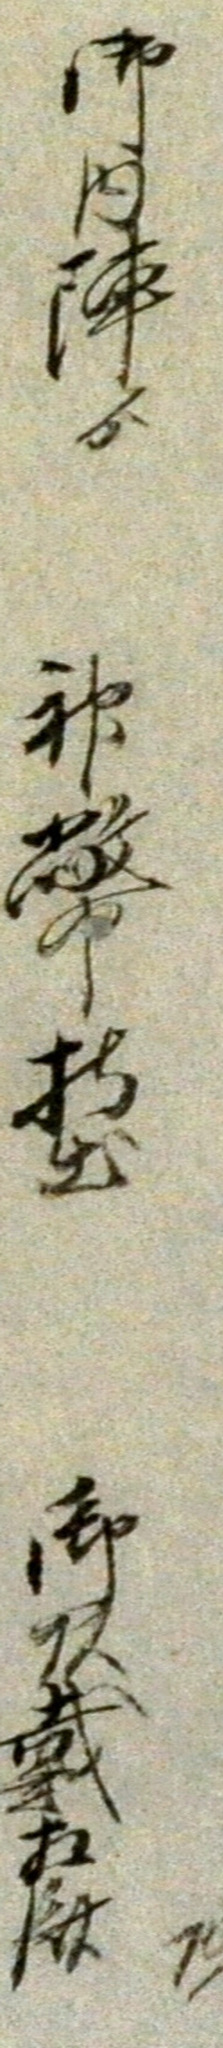御内陣ゟ神幣持出御頂戴相済
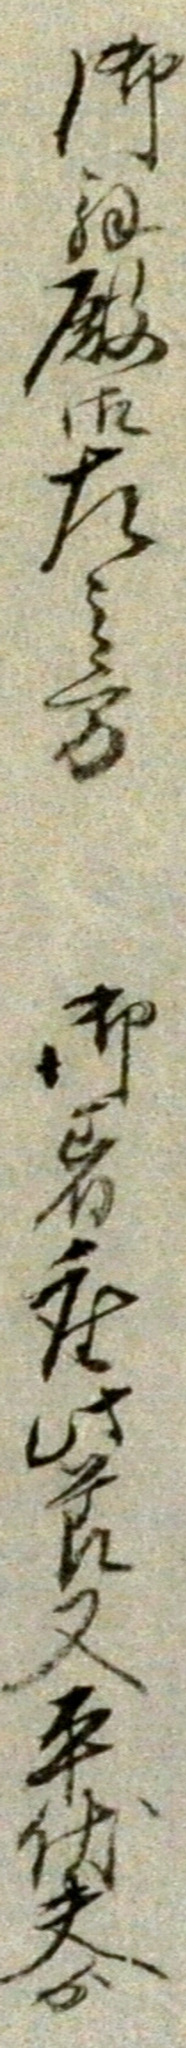御拝殿御左之方御着座此節又平伏夫ゟ
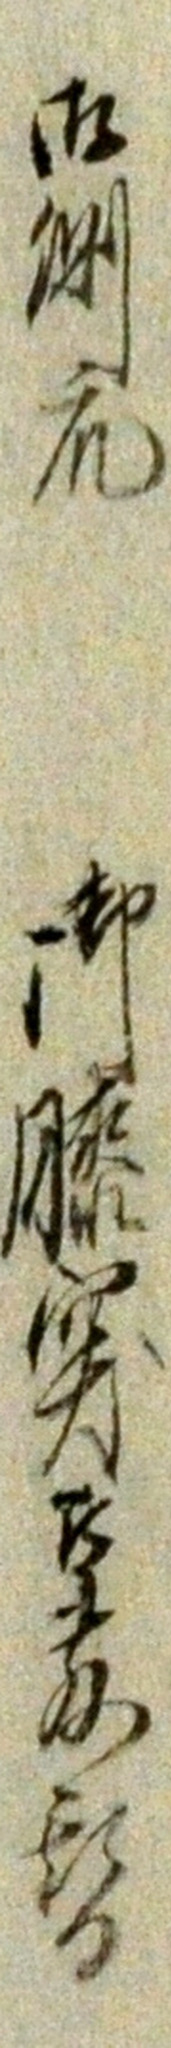御側衆御膝突被敷替
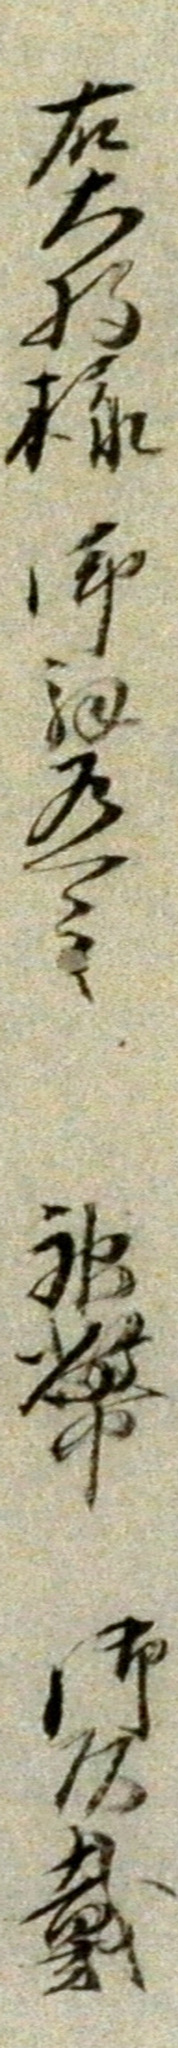右大将様御拝有之神幣御頂戴
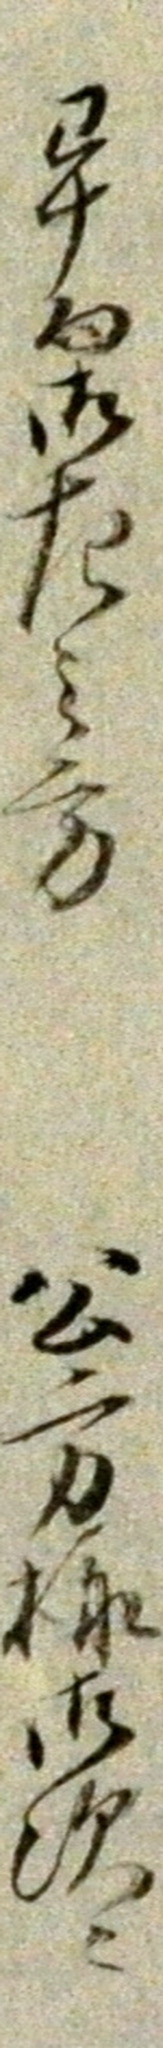畢而御左之方公方様御次ニ
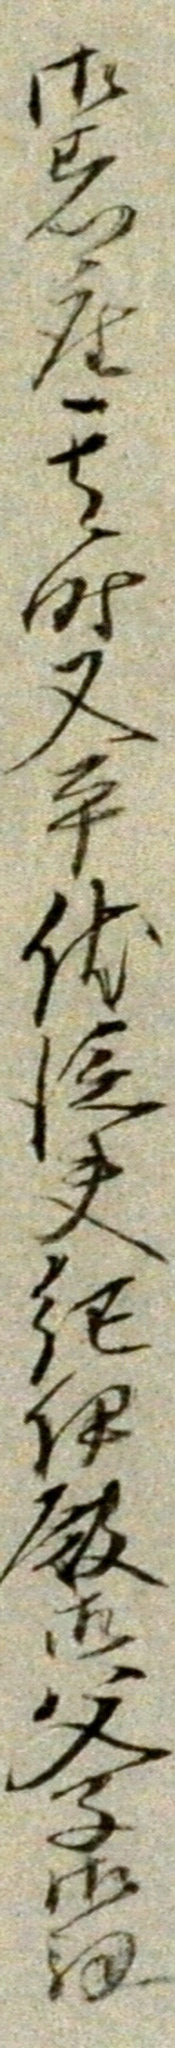御着座其時又平伏従夫紀伊殿御父子御拝
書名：御鏡餅御用留（写）
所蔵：伊那市立高遠町図書館・合同会社AMANE
